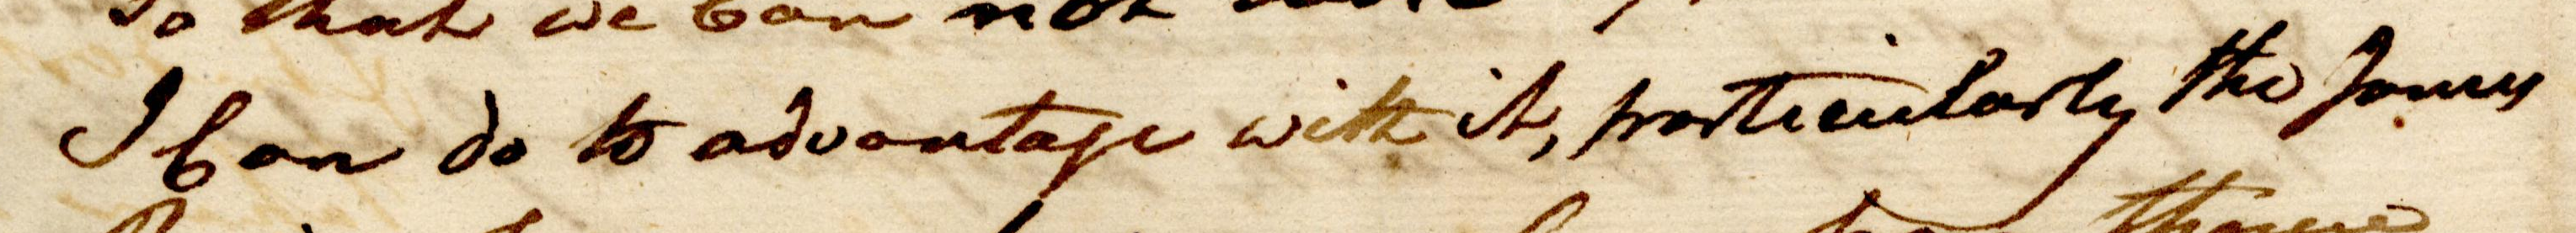I can do to advantage with it, particularly the James
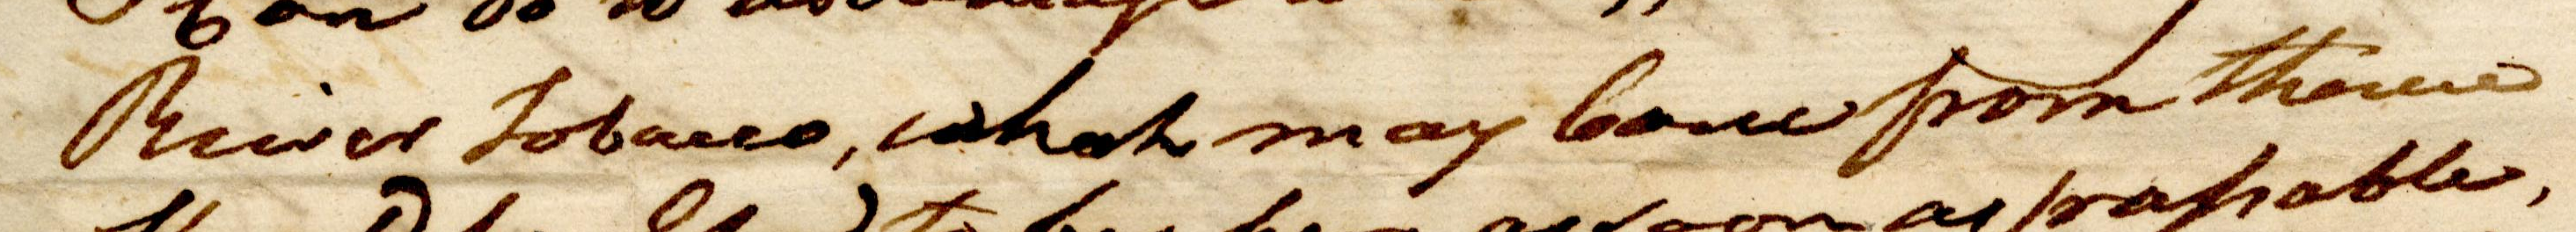River Tobacco, which may Come from there
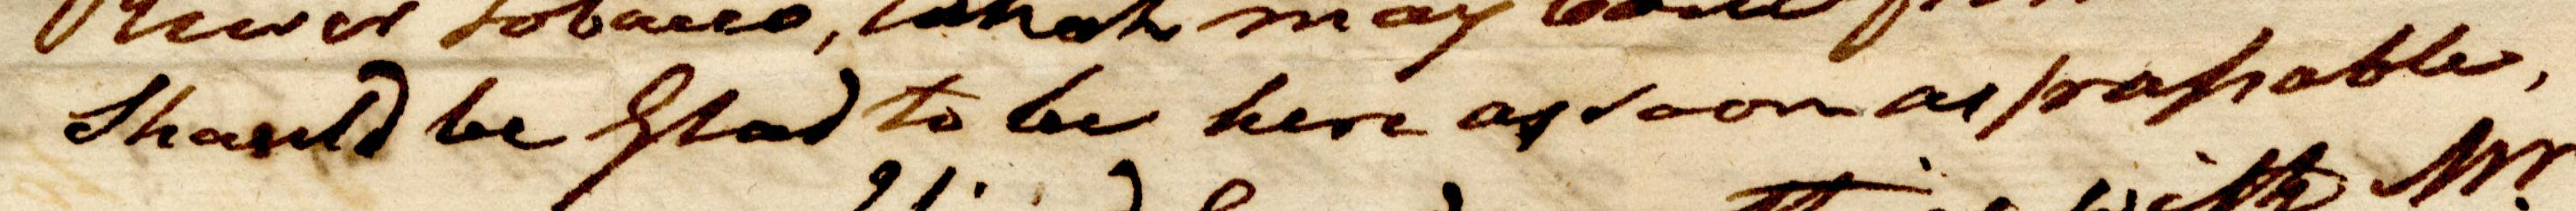should be Glad to be here as soon as possable
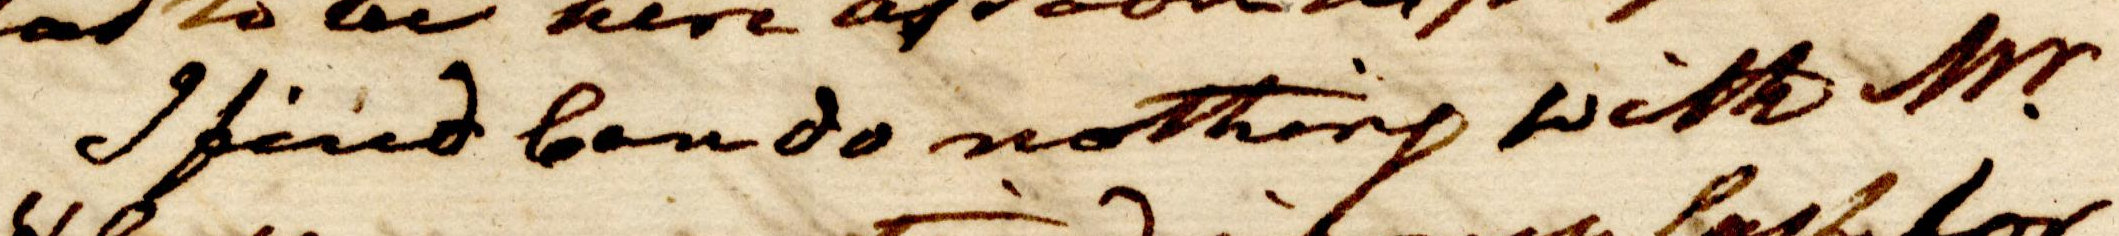I find Can do nothing with M^r
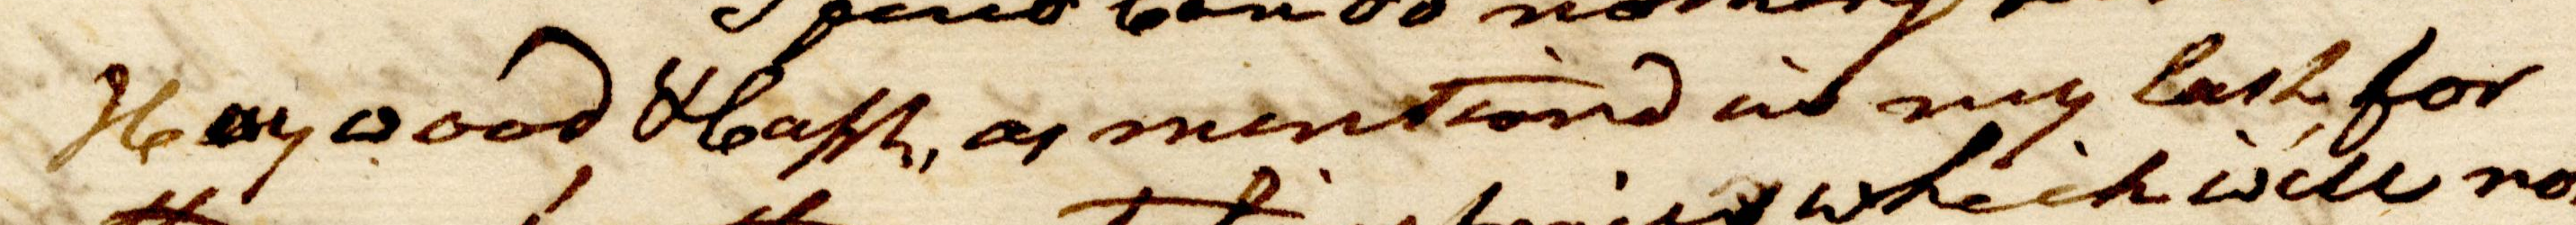Haywood & Captn, as mentiond in my last for
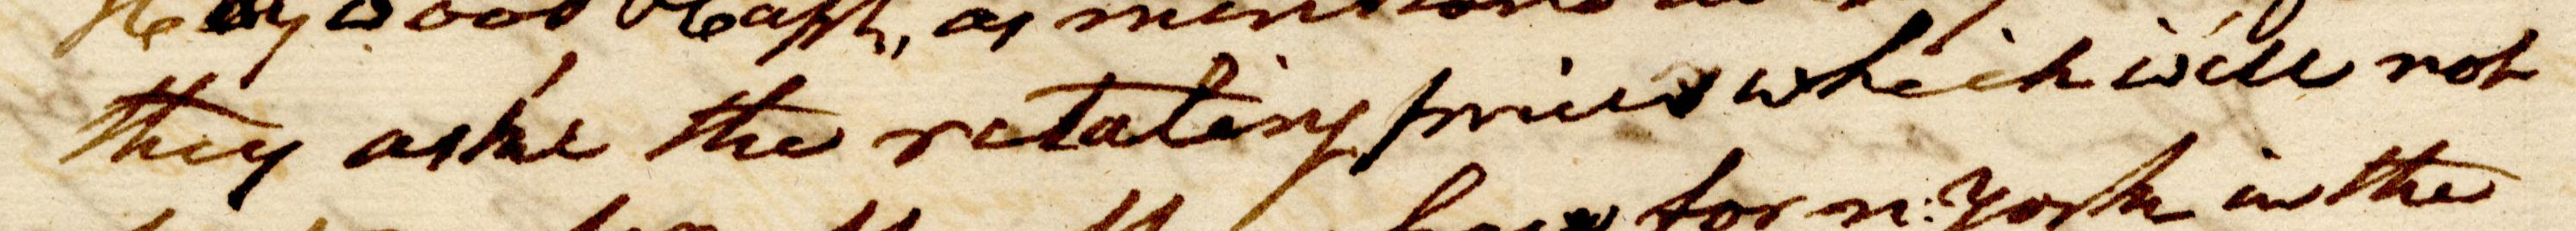they aske the retaling prices which will not
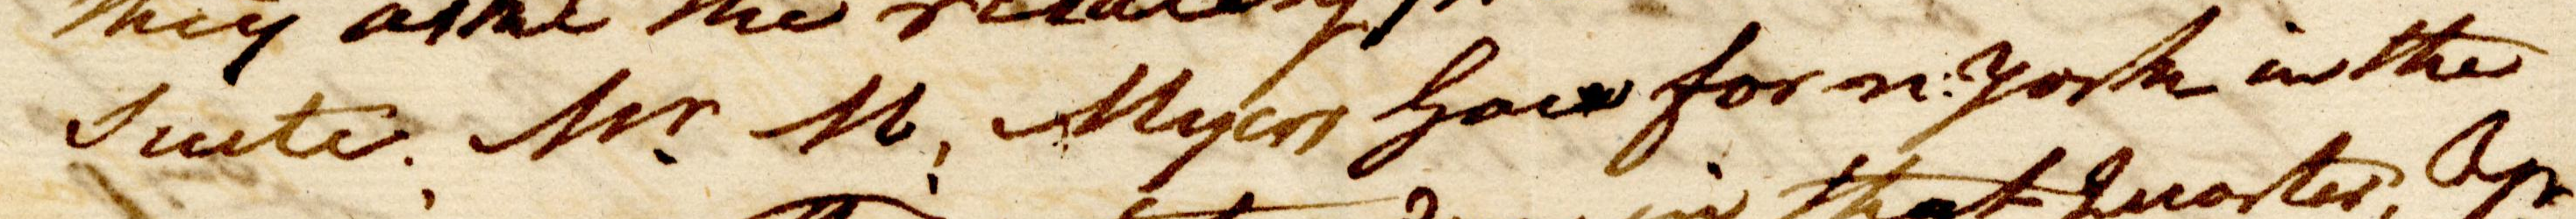Suite. M^r M. Myers goes for N York in the
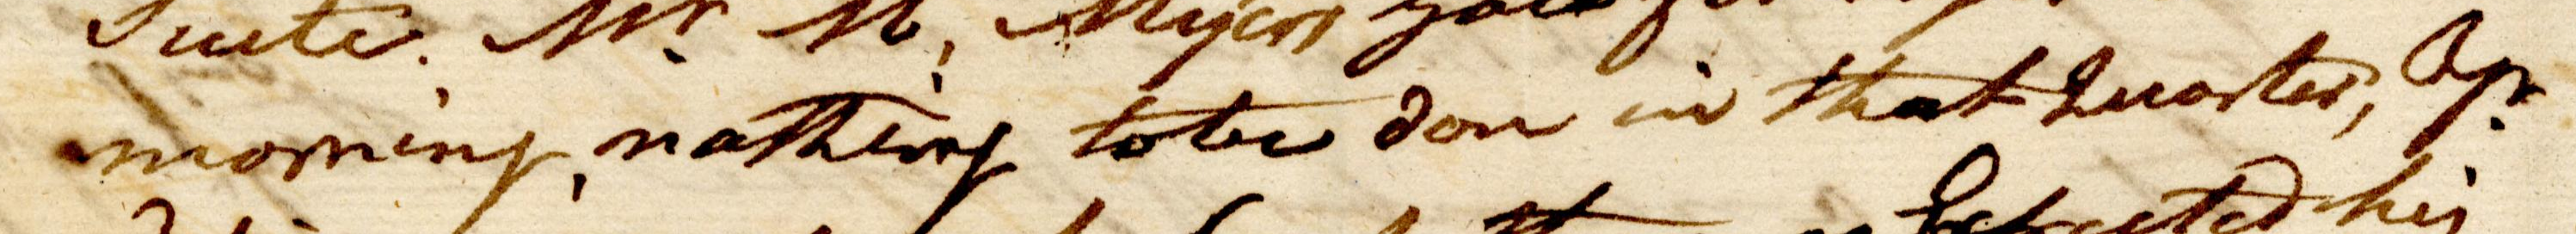morning, nothing to be don in that quarter, y^r.
